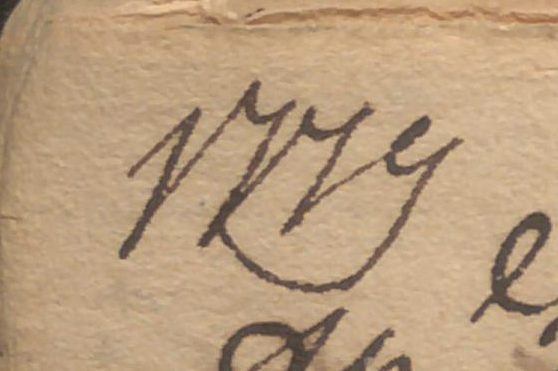1779
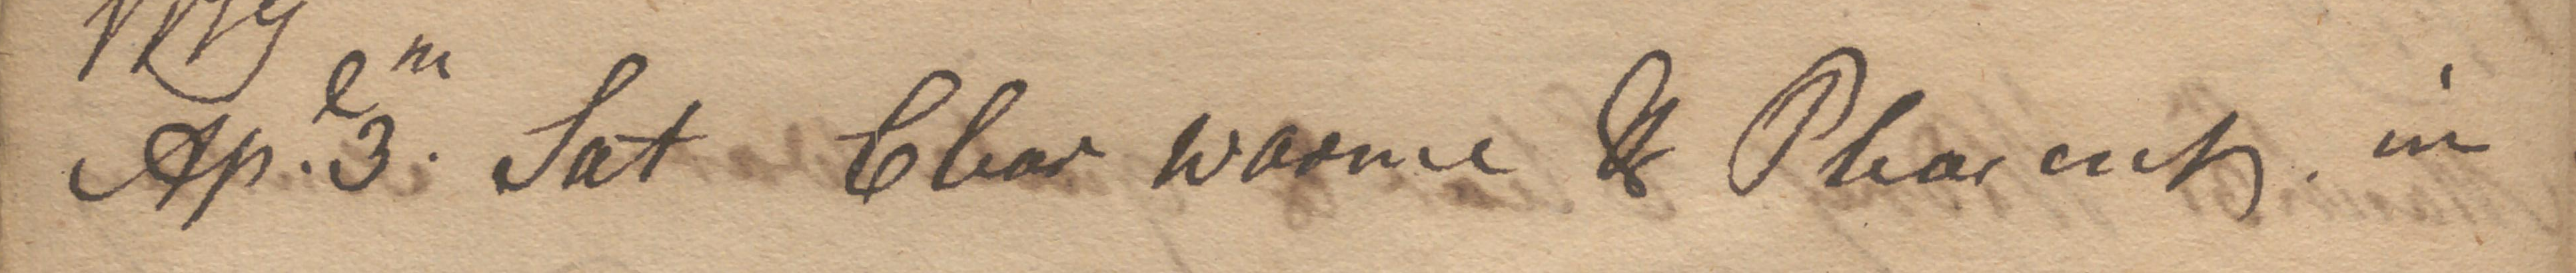Ap^l. 3^th. Sat Clear warme & Pleasent in
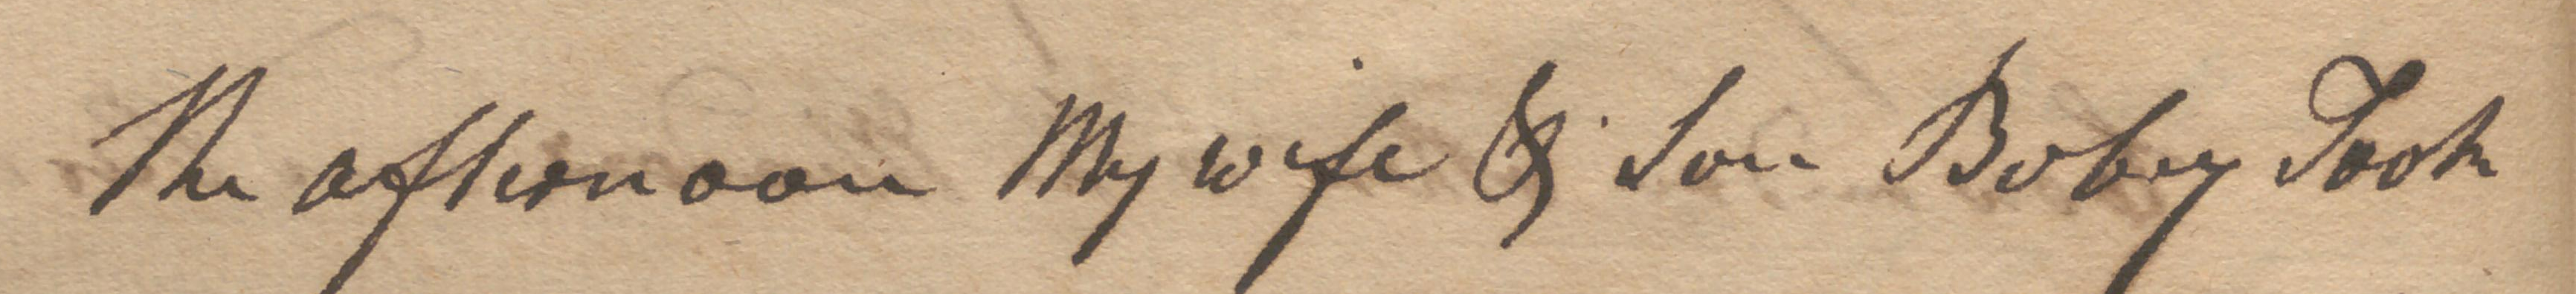the afternoon My wife & son Bobey Took
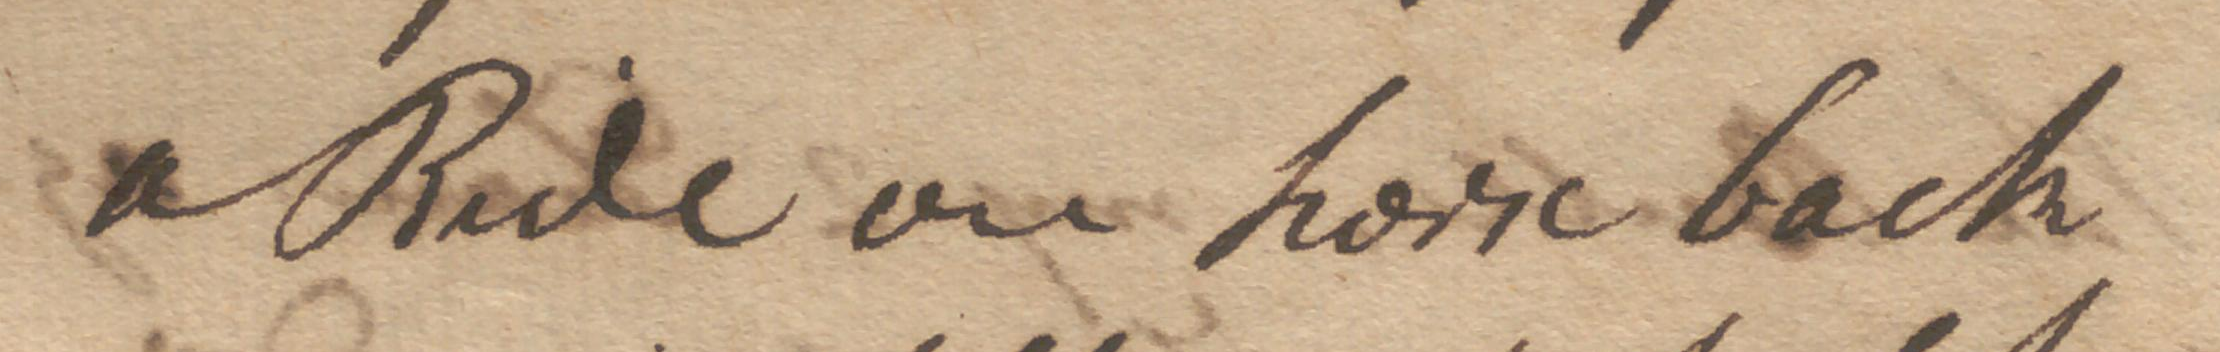a Ride on horse back
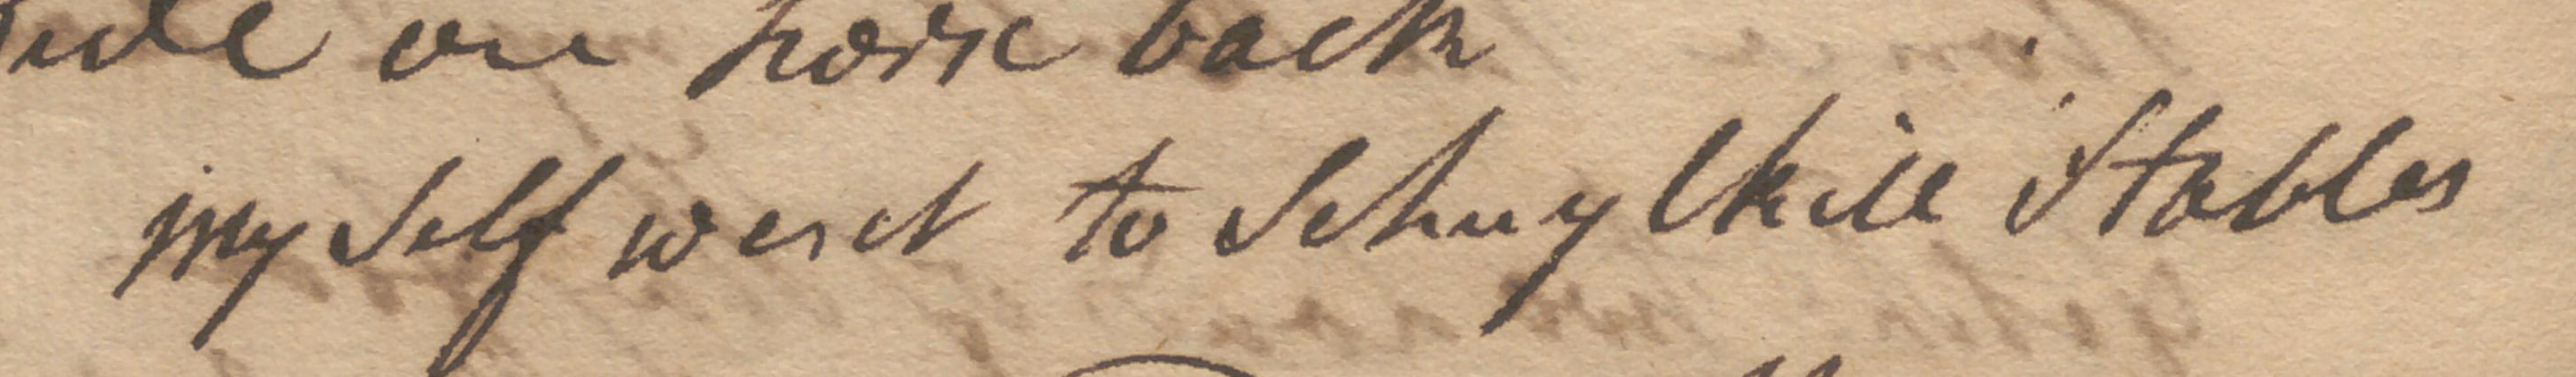my self went to Schuylkill Stables
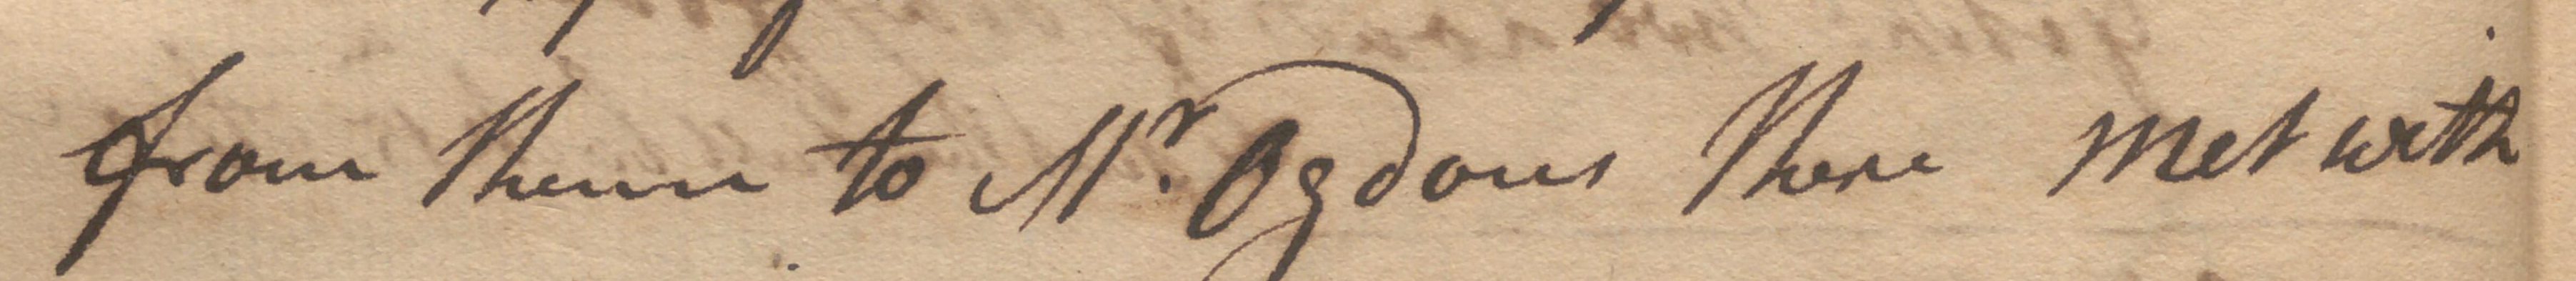frou thence to M^r. Ogdons there met with
